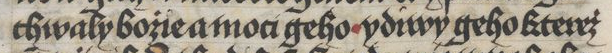chwaly bożie a moci geho.ydiwy geho ktereż
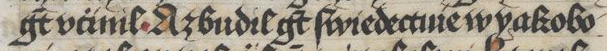ḡt vċinil.A zbudil ḡt ſwiedectuíe w yakobo¬
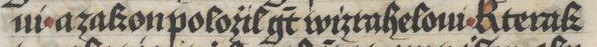ui.azakon polożil ḡt wizraheloui.Kterak
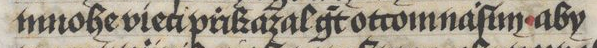mnohe vieci pṙikazal ḡt otcom naẛim.aby
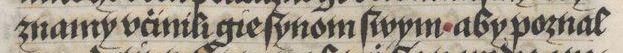znamy vċinili gie ſynom ſwym.aby poznal
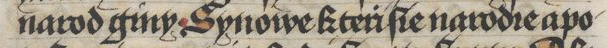narod giny.Synowe kteṙi ſie narodie a po¬
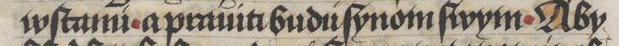wſtanú.a prauiti budu ſynom ſwym.Aby¬
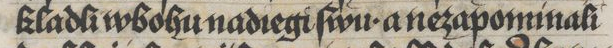kladli wbohu nadiegi ſwu.a nezapominali
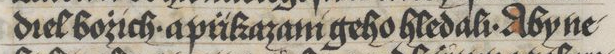diel bożích.a pṙikazani geho hledali.Aby ne¬
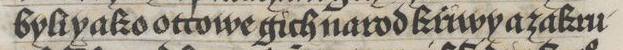byli yako otcowe gich narod kṙiwy a zakru¬
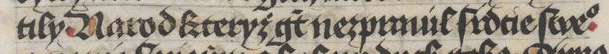tily.Narod kteryż ḡt nezprauil ſrdcie ſweo
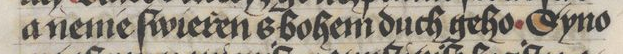a nenie ſwieṙen s bohem duch geho.Syno¬
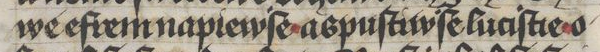wé efrem napiewẛe.a spuſtiwẛe luciẛtie.o¬
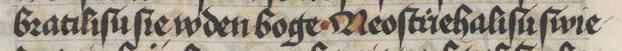bratiliſu ſie wden boge.Neoſtṙiehaliſu ſwie¬
